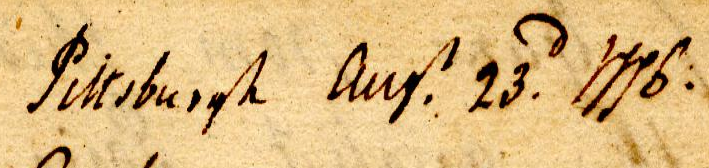Pittsburgh Aug^t. 23^d. 1776.
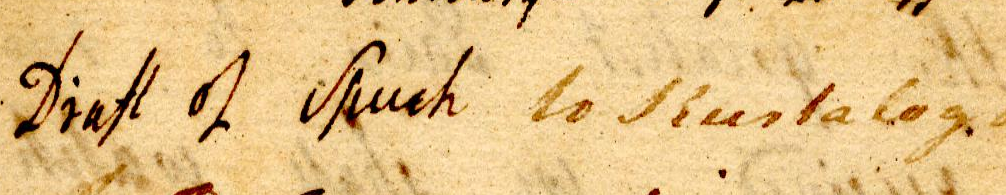Draft of Speech to Kustaloga
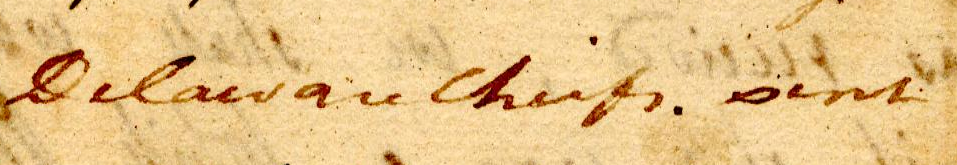Delaware Chiefs, sent
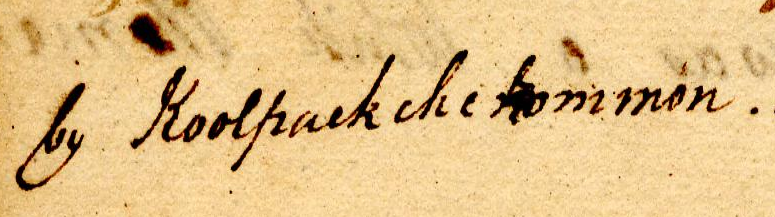by Koolpackchekommon.-
